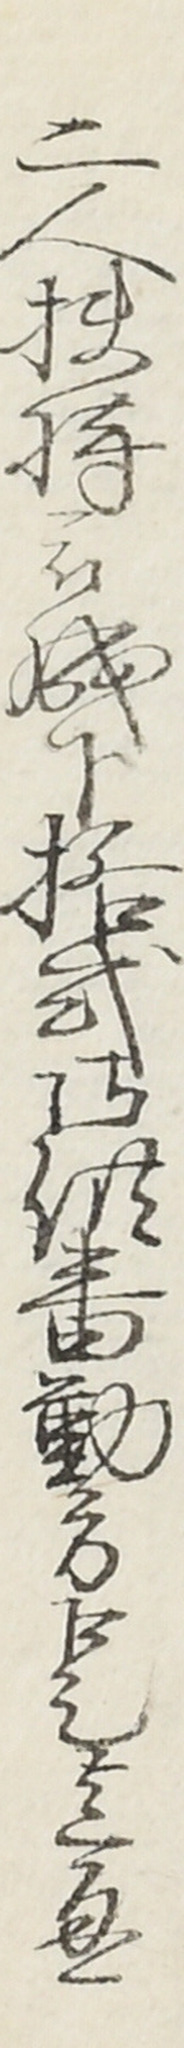二人扶持被成下格式御供番勤方是迄通
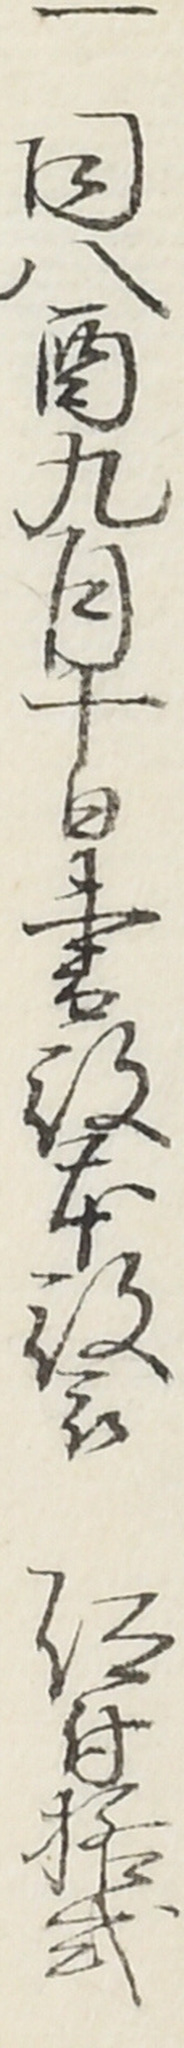一同八酉九月十日書役本役被仰付格式

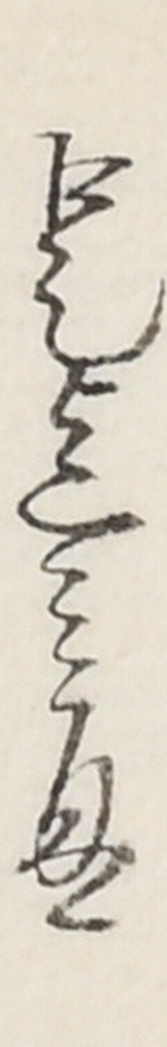是迄之通
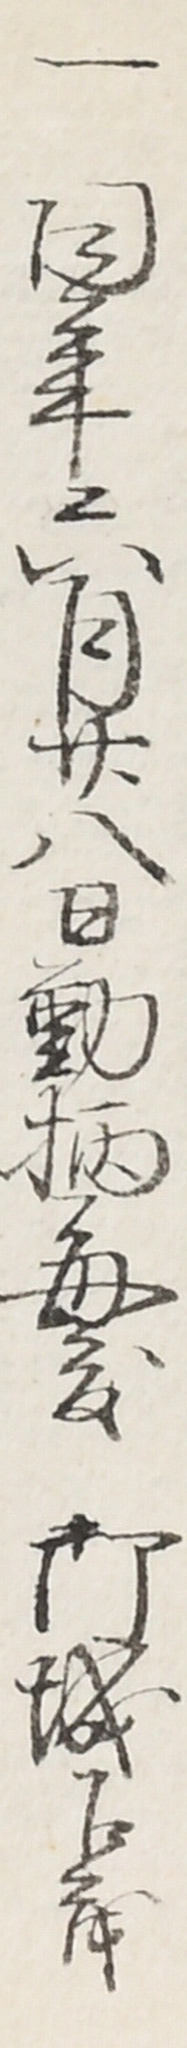一同年六月廿八日勤柄毎度御城江茂
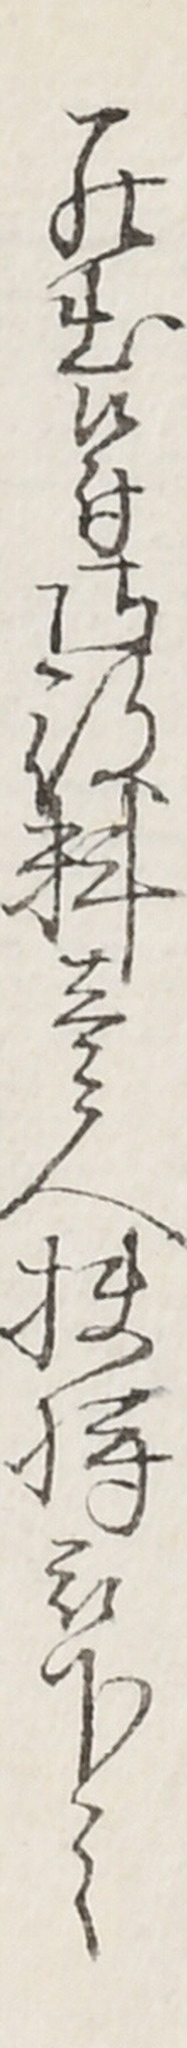罷出候付御役料壱人扶持被下之
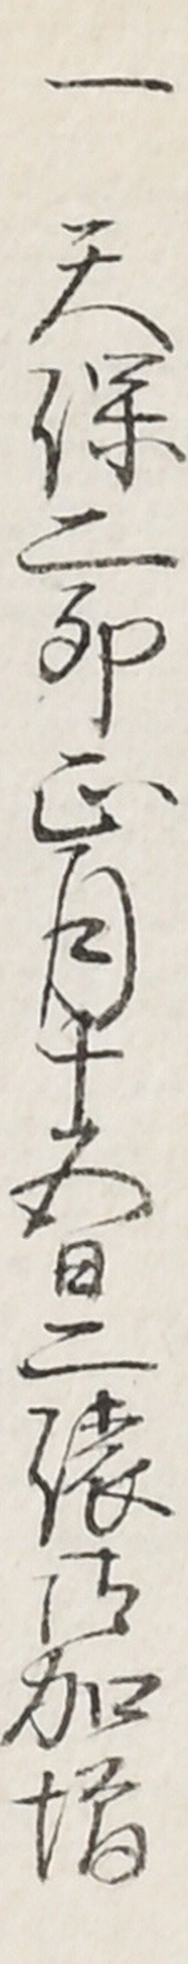一天保二卯正月十五日二俵御加増
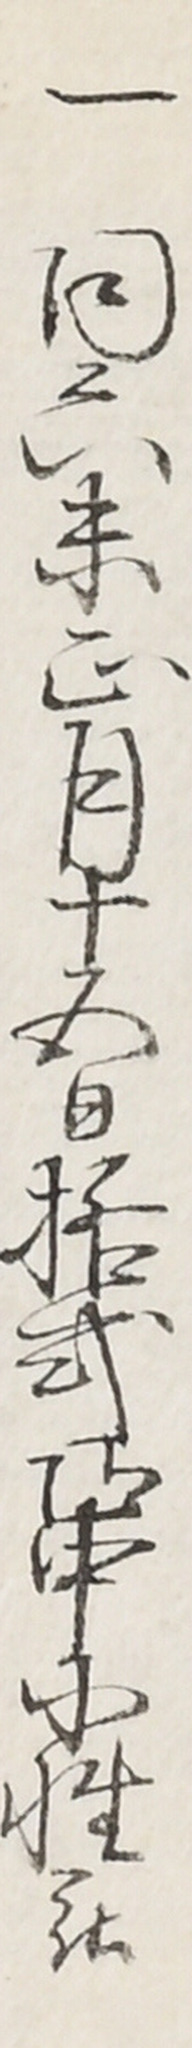一同六未正月十五日格式御中小性被
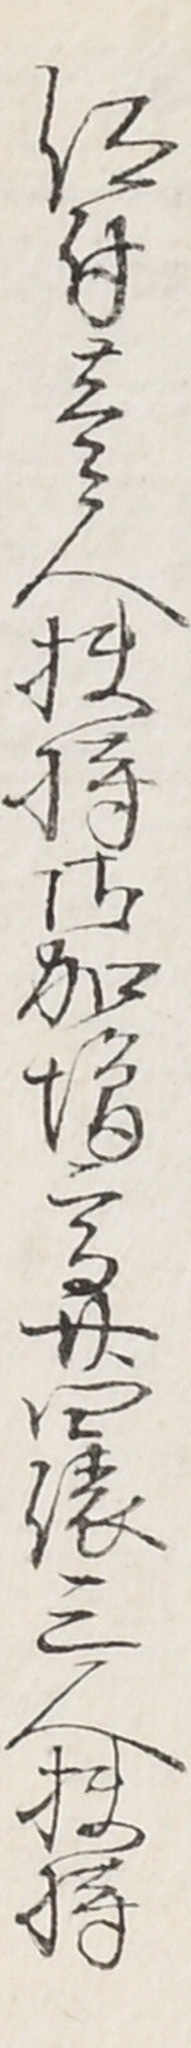仰付壱人扶持御加増高廿四俵三人扶持
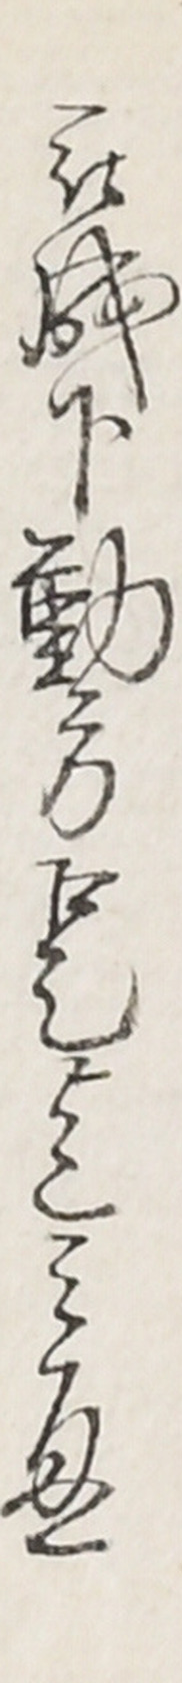被成下勤方是迄之通
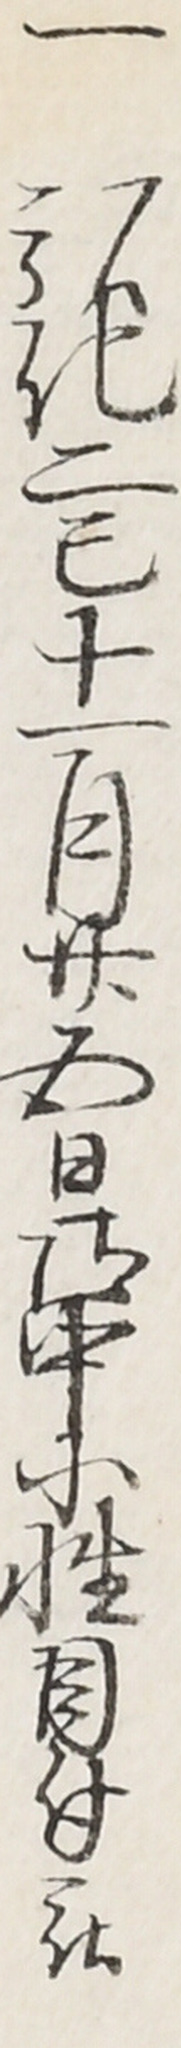一弘化二巳十一月廿五日御中小性目付被
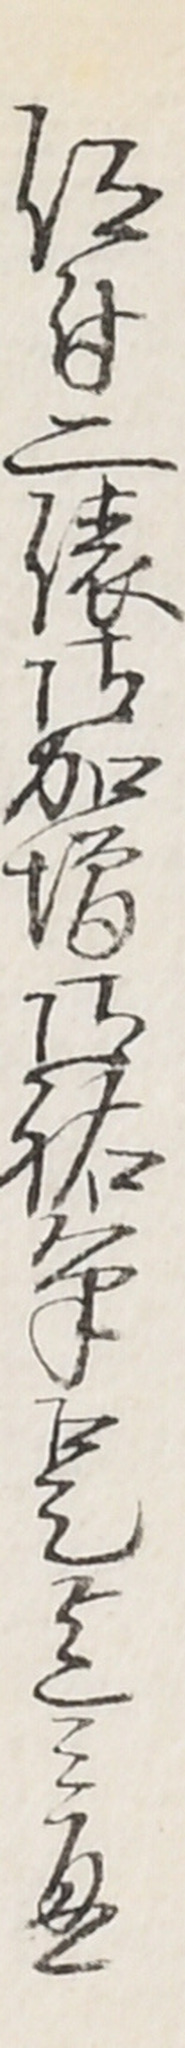仰付二俵御加増御祐筆是迄之通
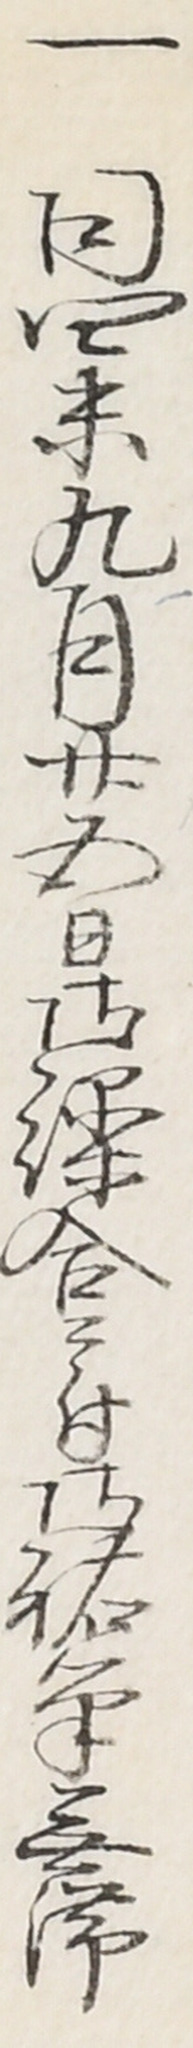一同四未九月廿五日御繰合ニ付御祐筆無滞
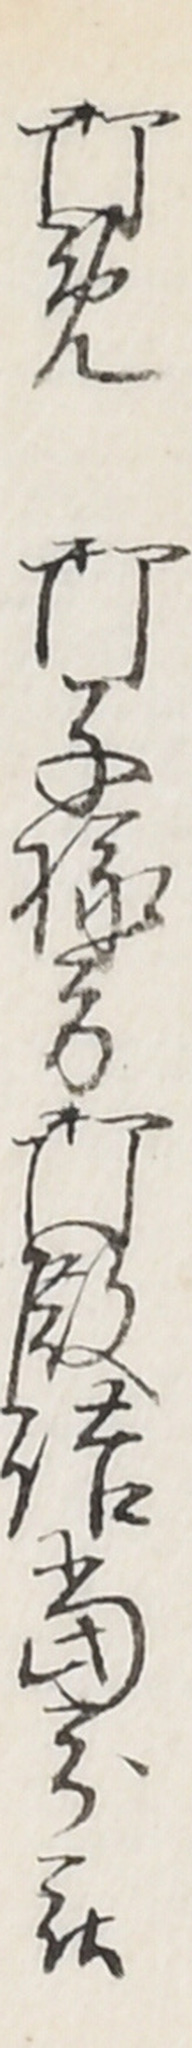御免御子様方御殿詰当分被
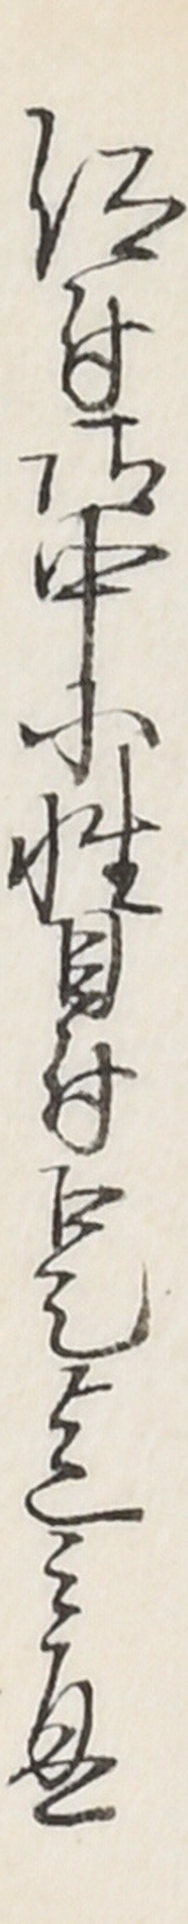仰付御中小性目付是迄之通
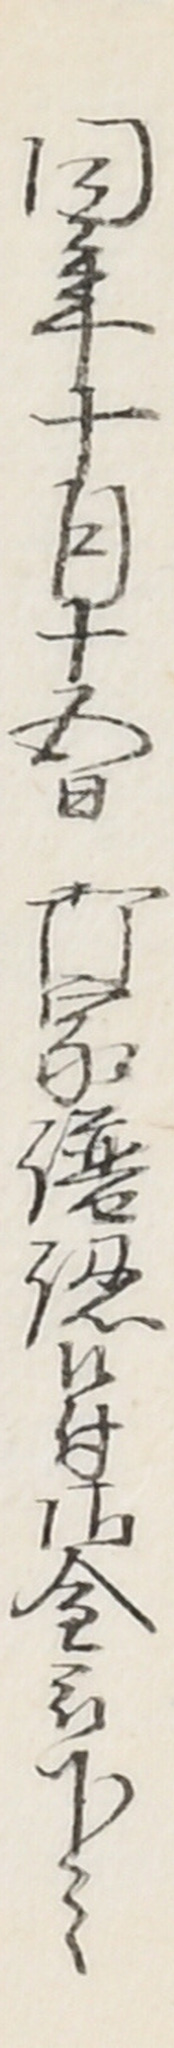一同年十一月十五日御家譜認候付金被下之
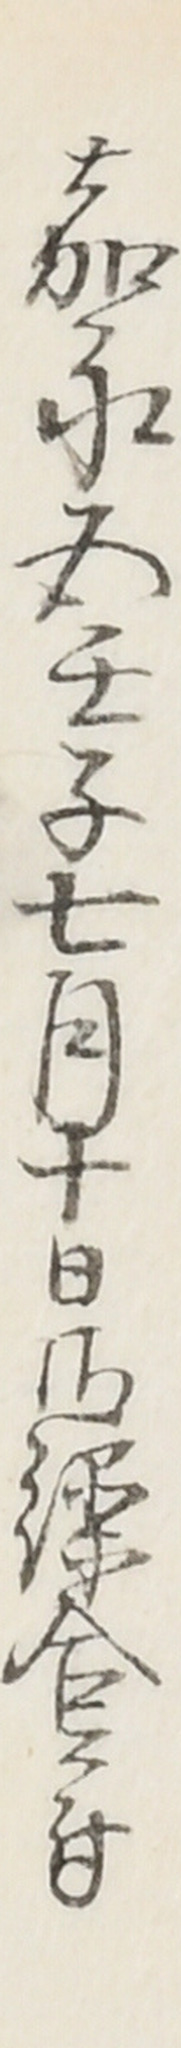一嘉永五壬子七月十日御繰合ニ付
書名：給人諸士勤仕録（七）
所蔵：伊那市立高遠町図書館・合同会社AMANE
